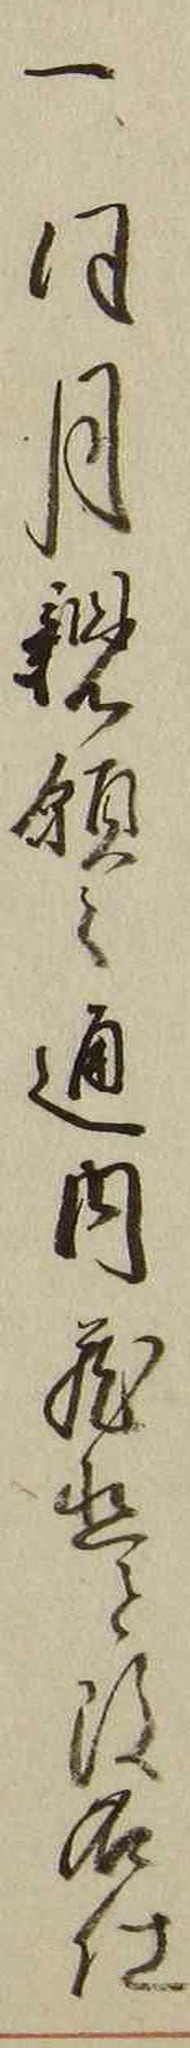一同月親願之通内蔵丞と改名仕
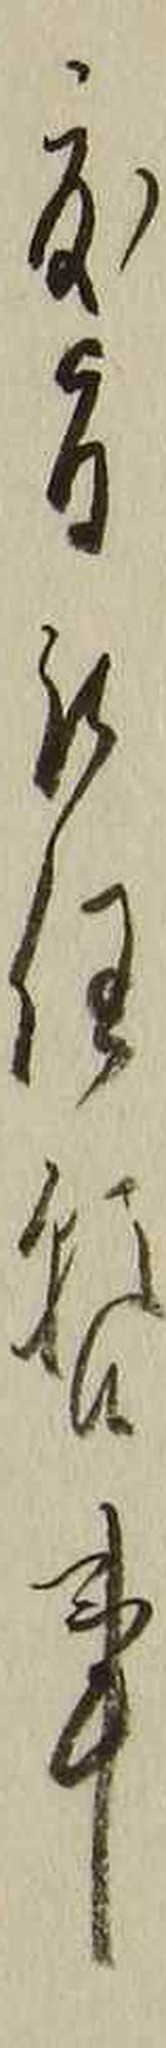度旨被任願候事
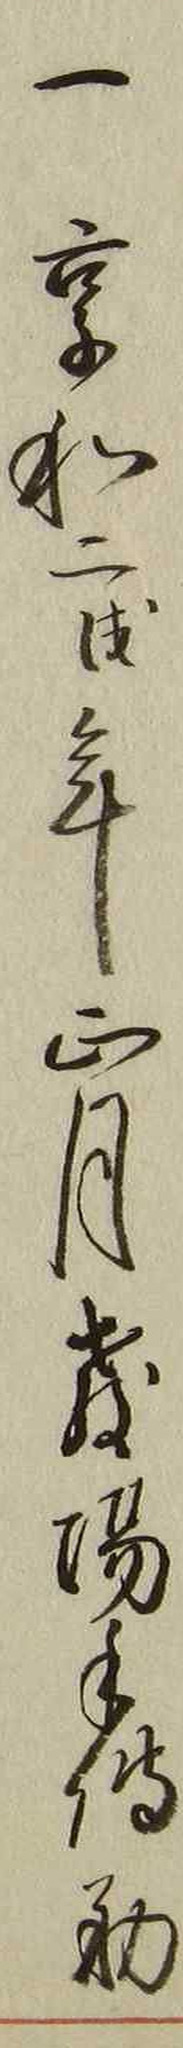一享和二戌年正月教場手伝勤
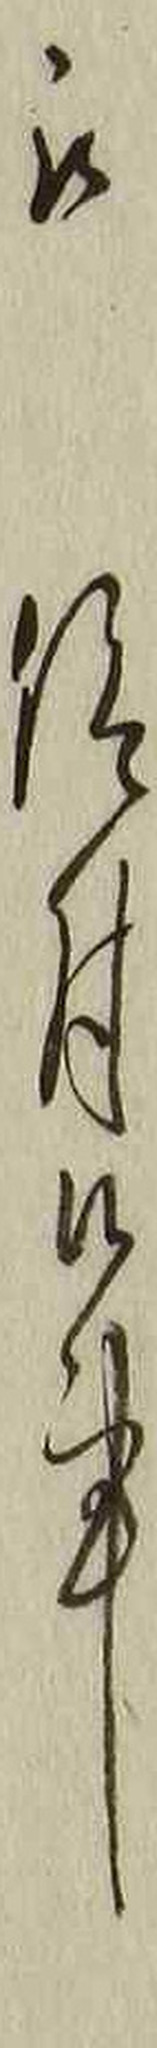被仰付候事
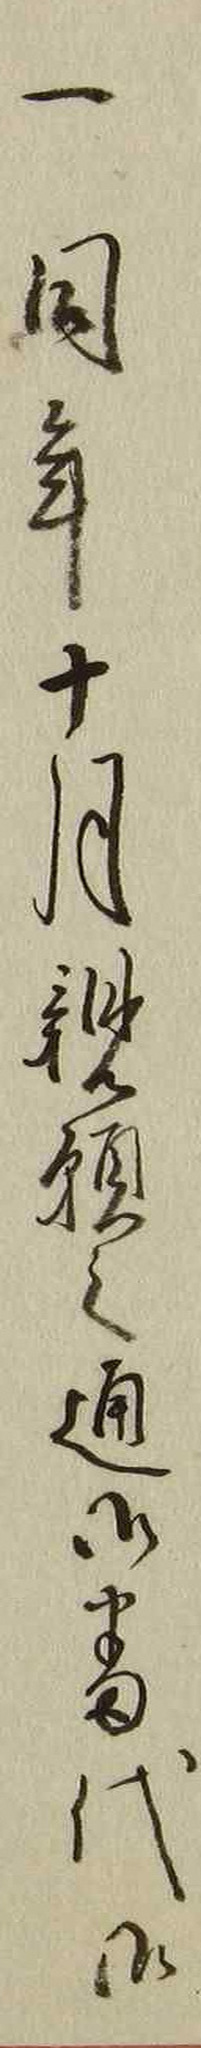一同年十月親願之通御番代御
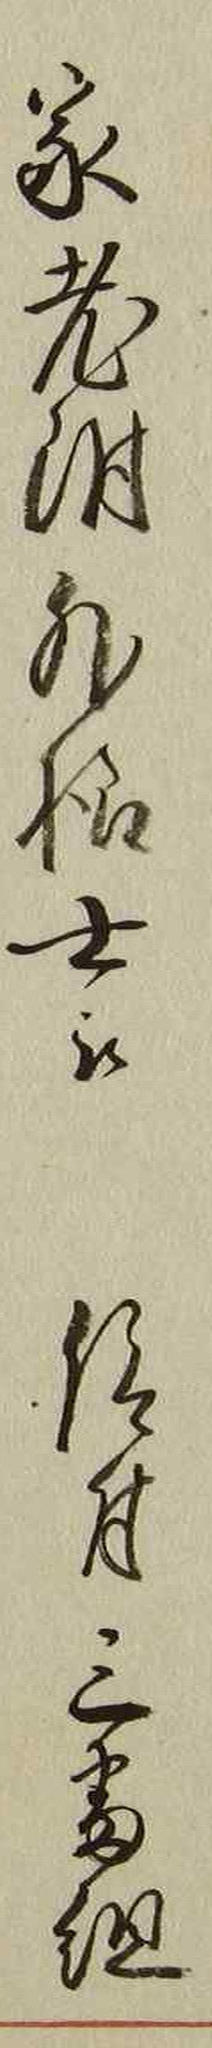家老付外様士被仰付三番組
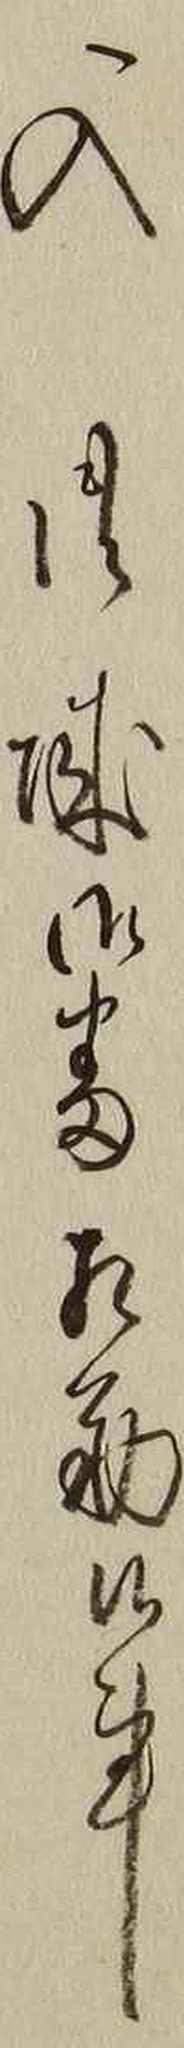へ入御城御番相勤候事
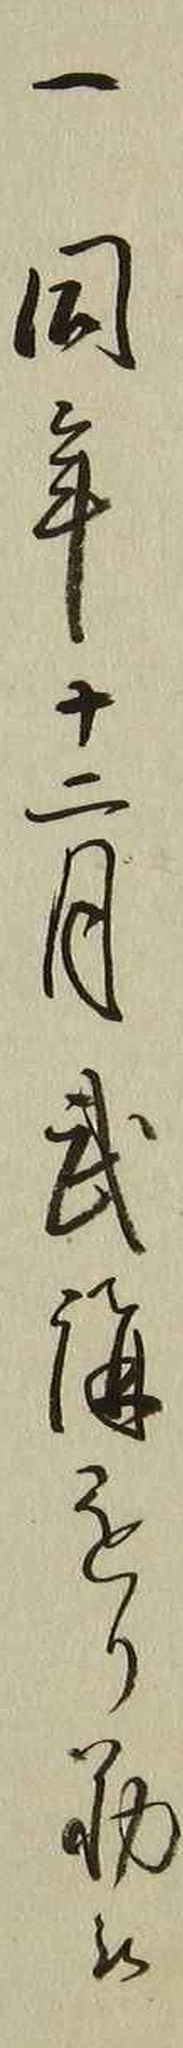一同年十二月武講懸り勤被
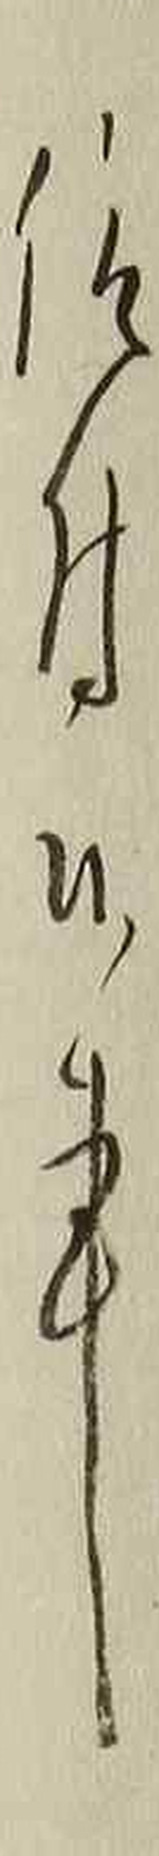仰付候事
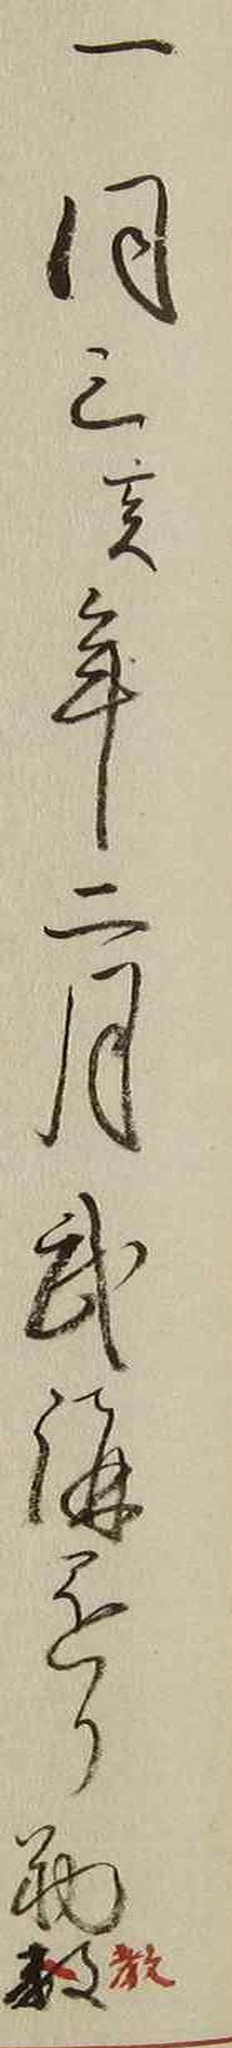一同年十二月武講懸り勤被
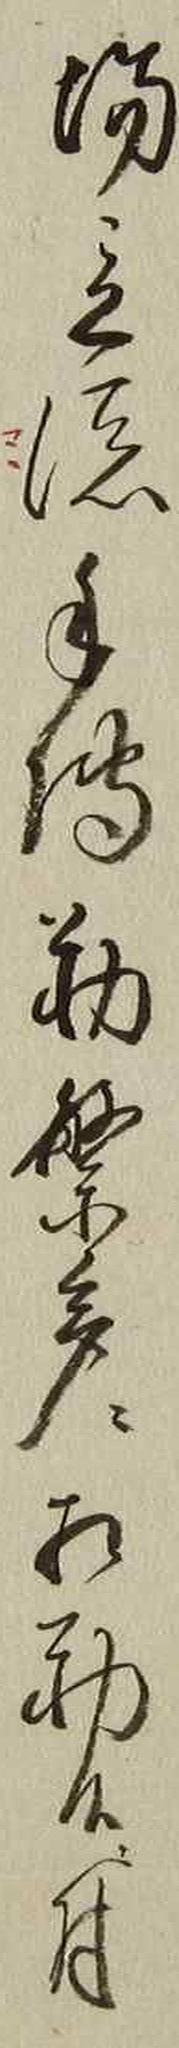場立添手伝勤繁多ニ相勤候ニ付
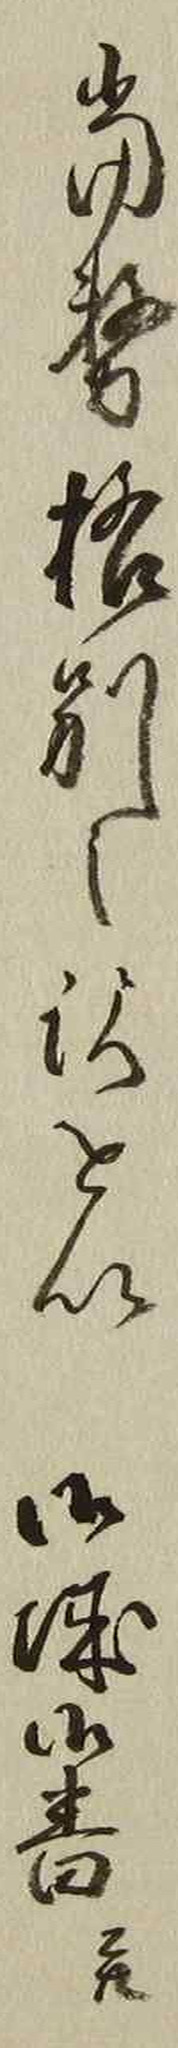当務格別之訳を以御城御番并
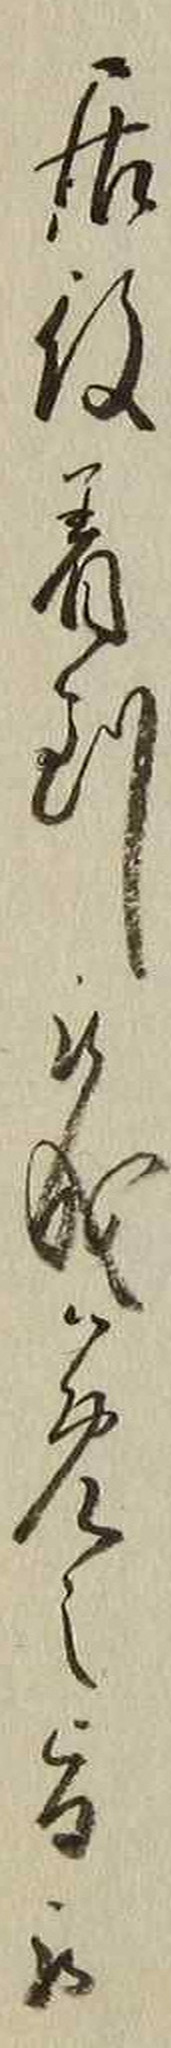居役着到被成御免之旨被
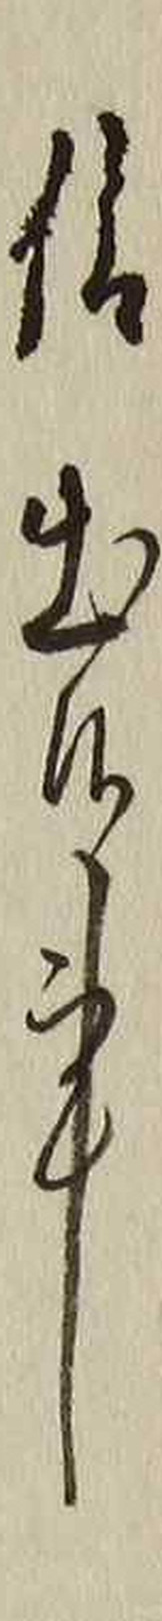仰付候事
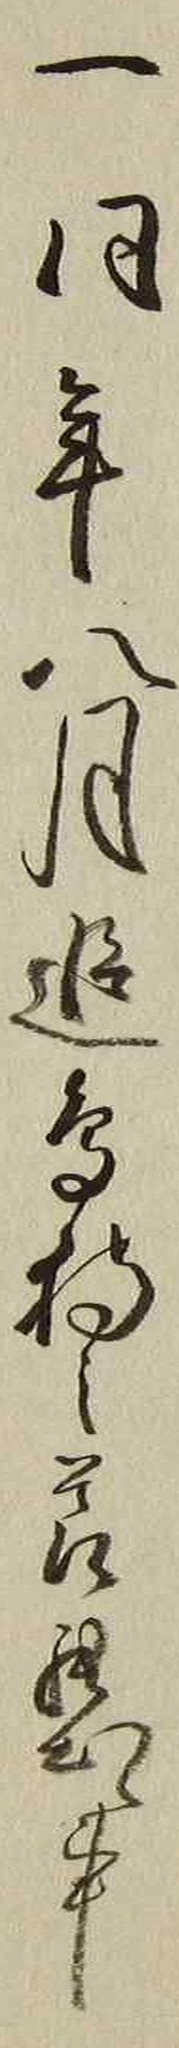一同年八月追鳥狩之節罷出候事
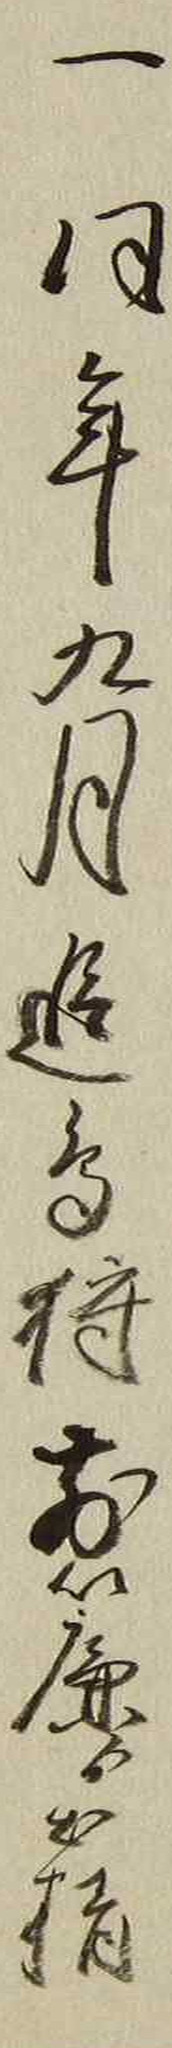一同年九月追鳥狩前簾ゟ出精
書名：諸士系譜　巻之1　い之部1
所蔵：会津若松市立会津図書館
